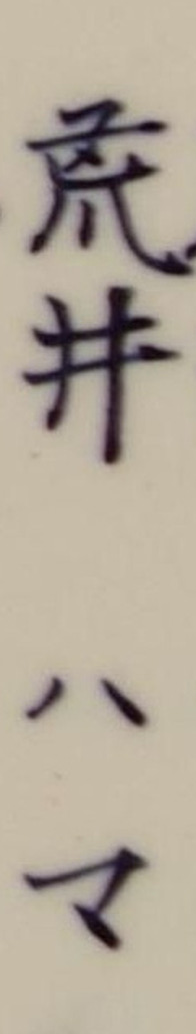荒井ハマ
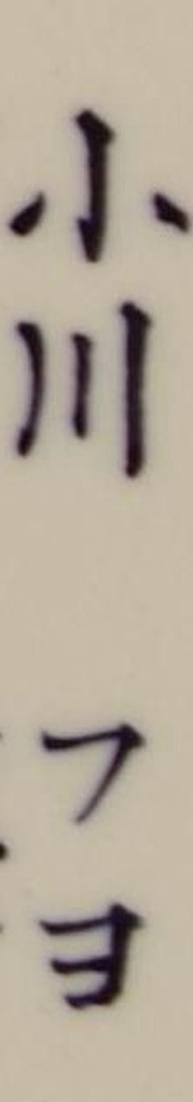小川フヨ
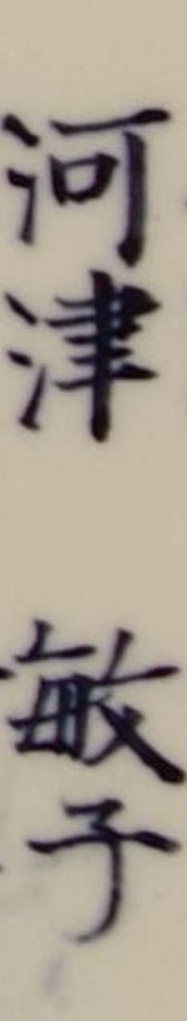河津敏子
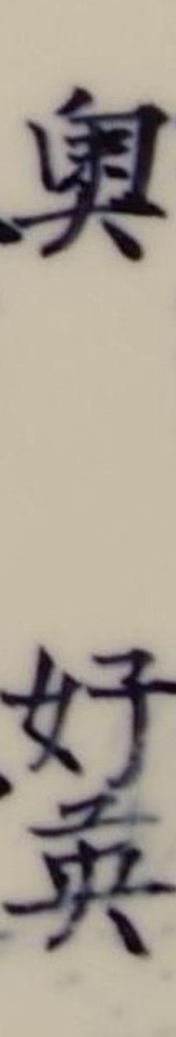奥好英
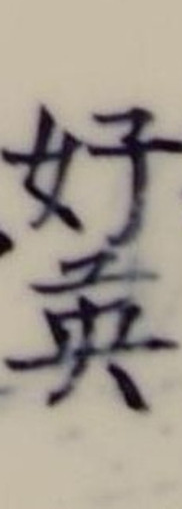奥好英
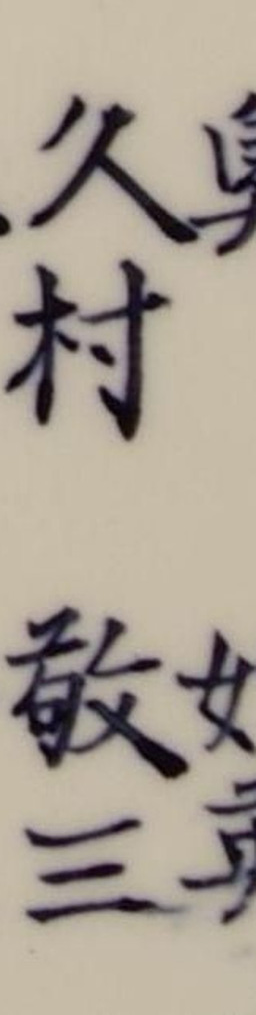久村敬三
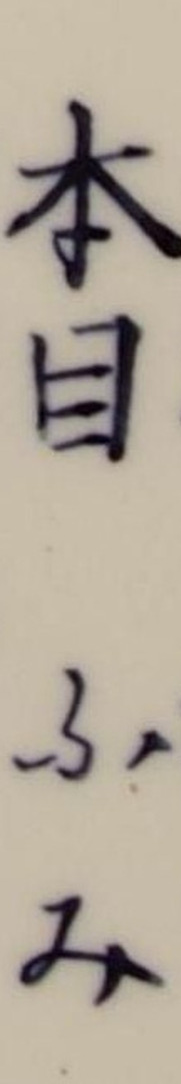本目ふみ
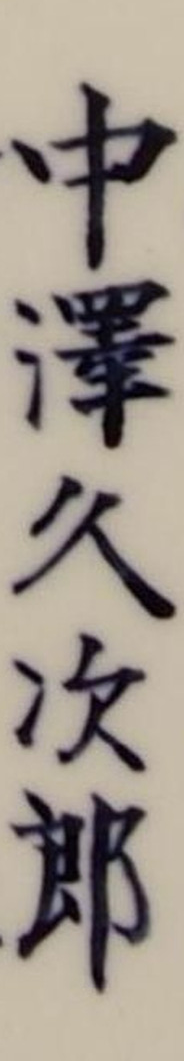中澤久次郎
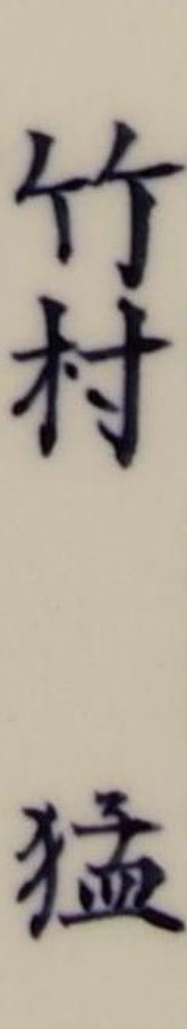竹村猛
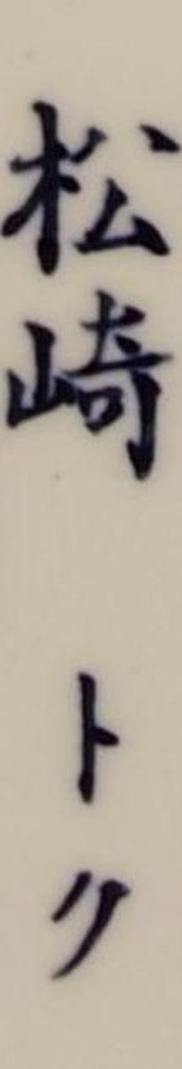松崎トク
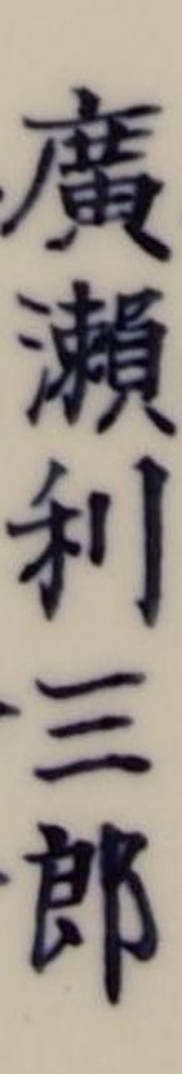廣瀬利三郎
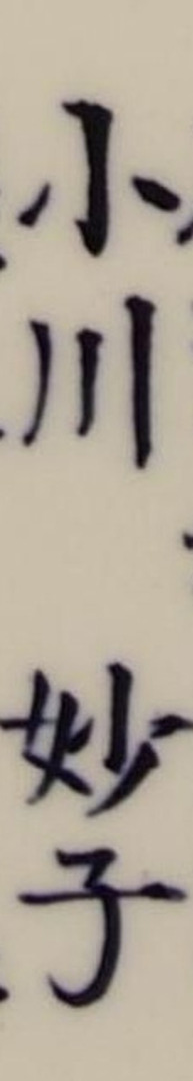小川妙子
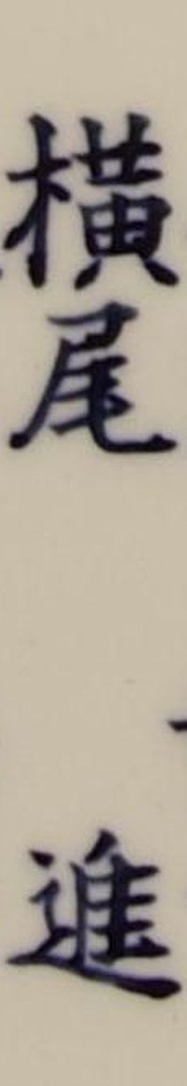横尾進
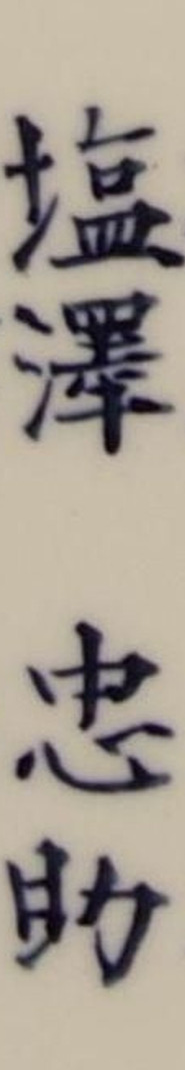塩澤忠助
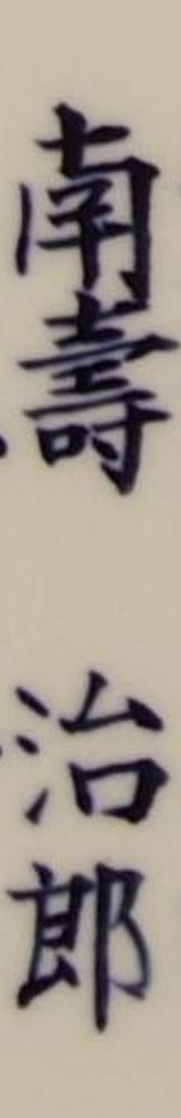南壽治郎
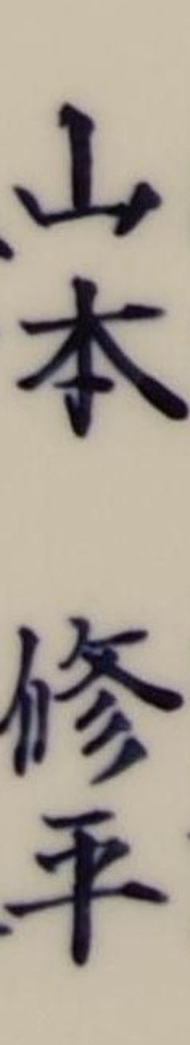山本修平
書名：E~L
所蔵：高野山金剛峯寺
